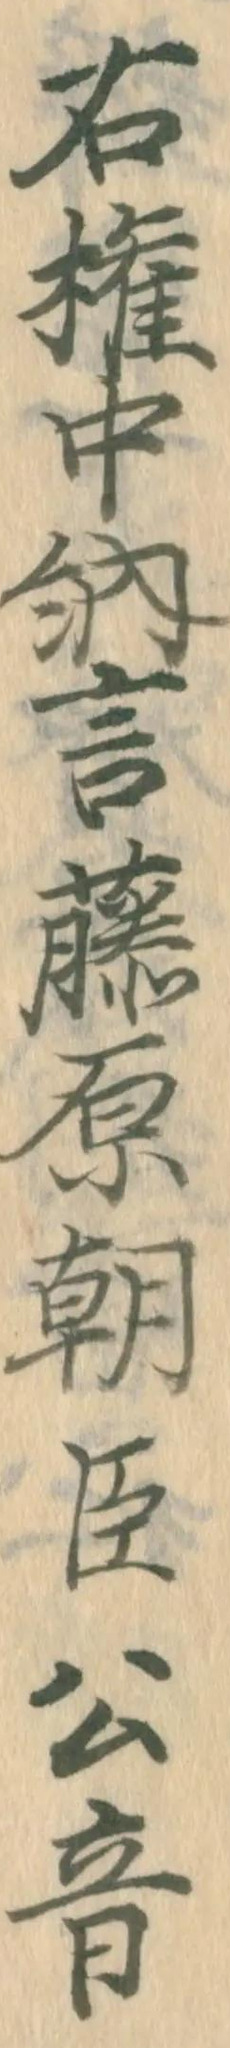右権中納言藤原朝臣公音
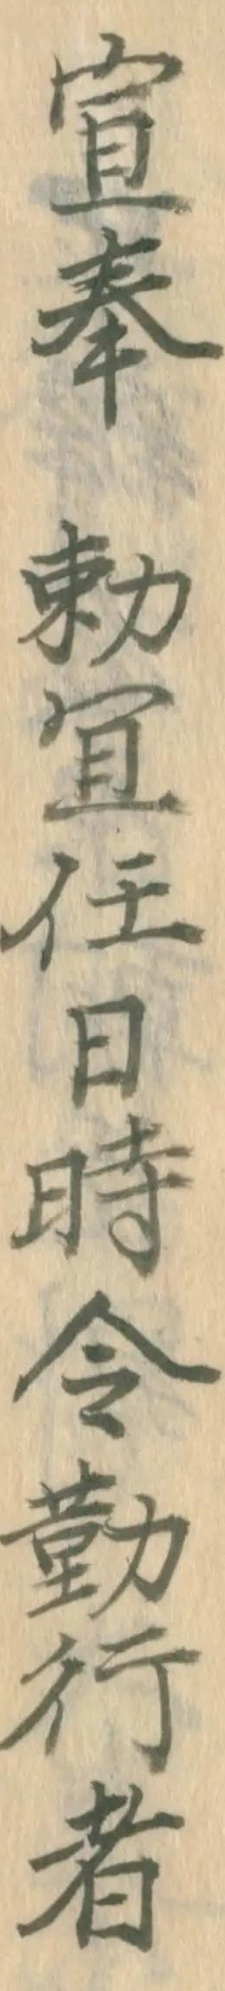宣奉勅宜任日時令勤行者
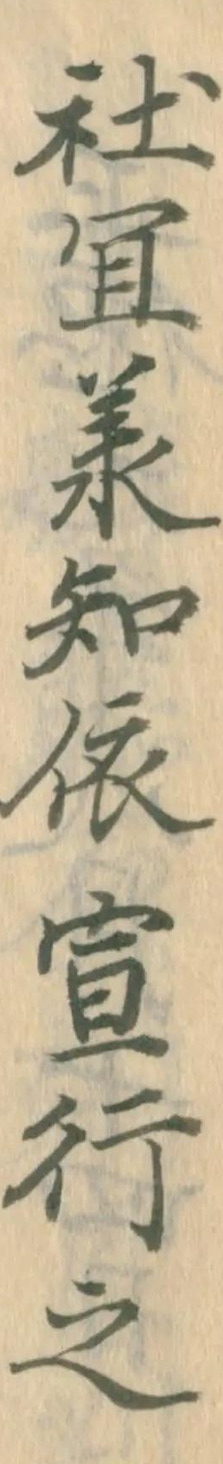社宜承知依宣行之

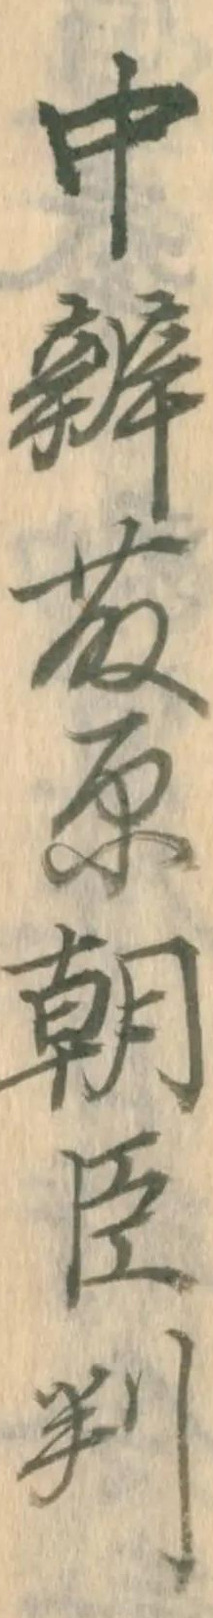中弁藤原朝臣判
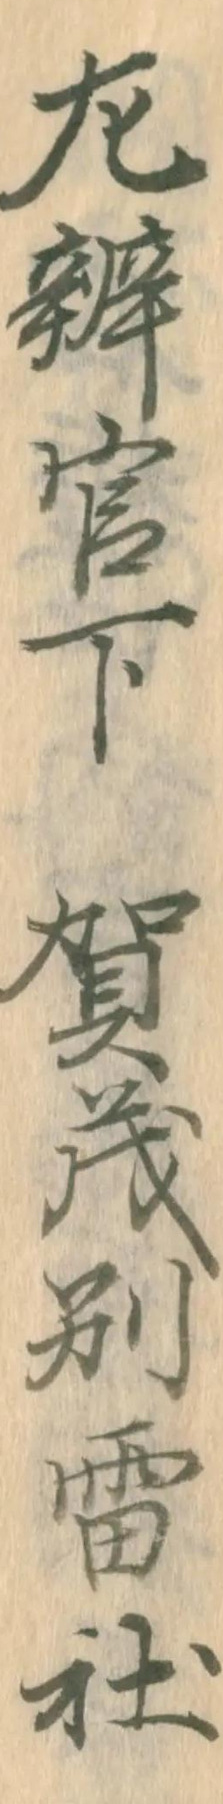左弁官下賀茂別雷社
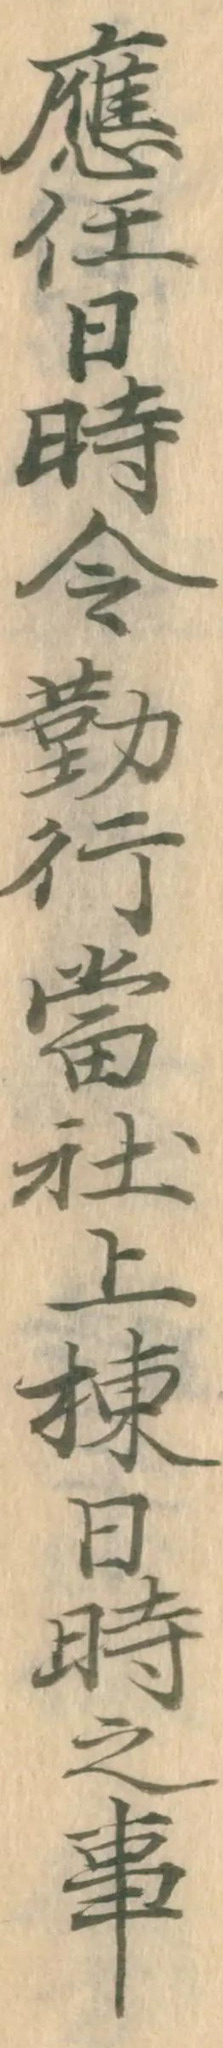応任日時令勤行当社上棟日時之事
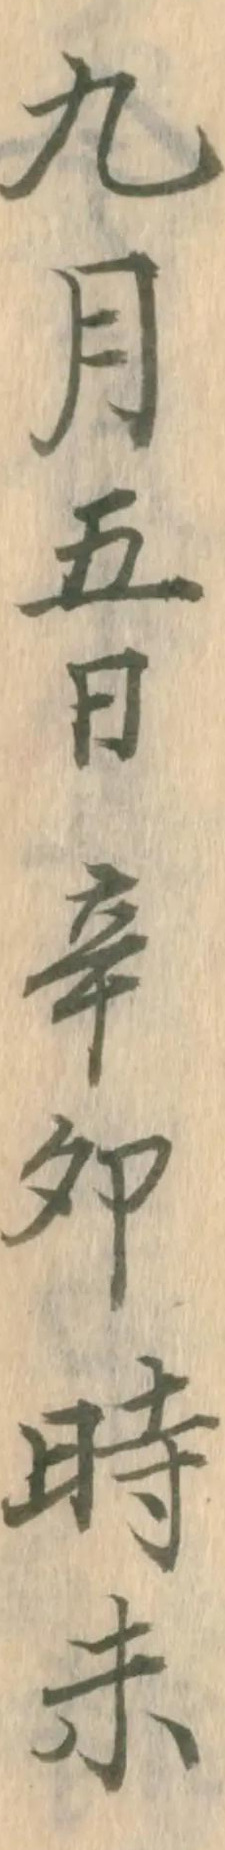九月五日辛卯時未
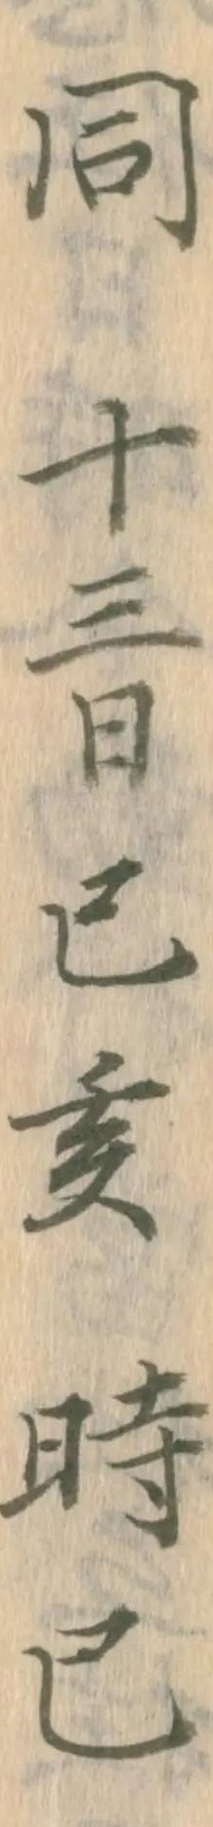同十三日己亥時巳
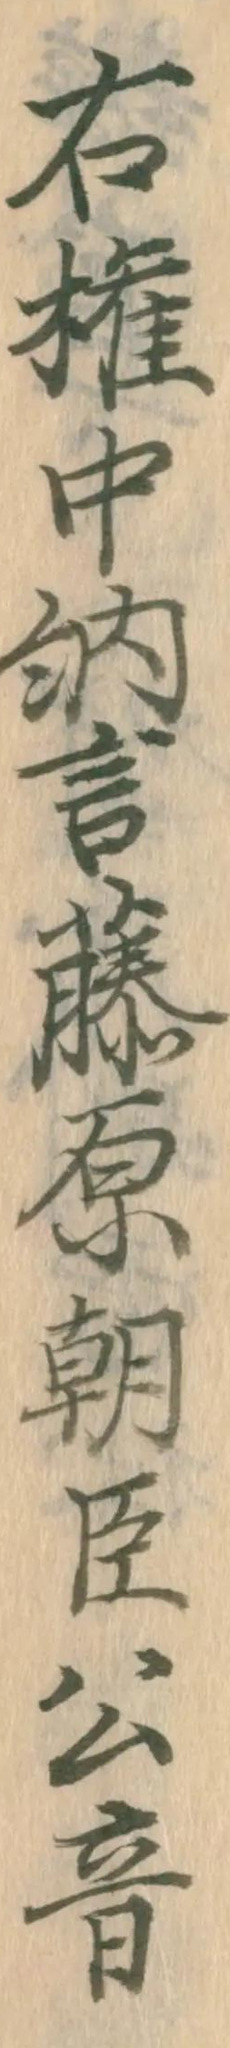右権中納言藤原朝臣公音
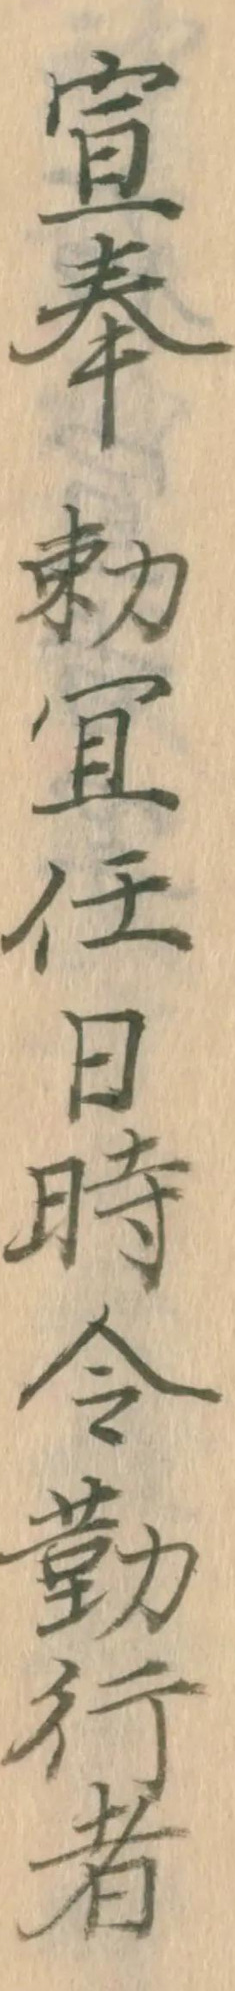宣奉勅宜任日時令勤行者
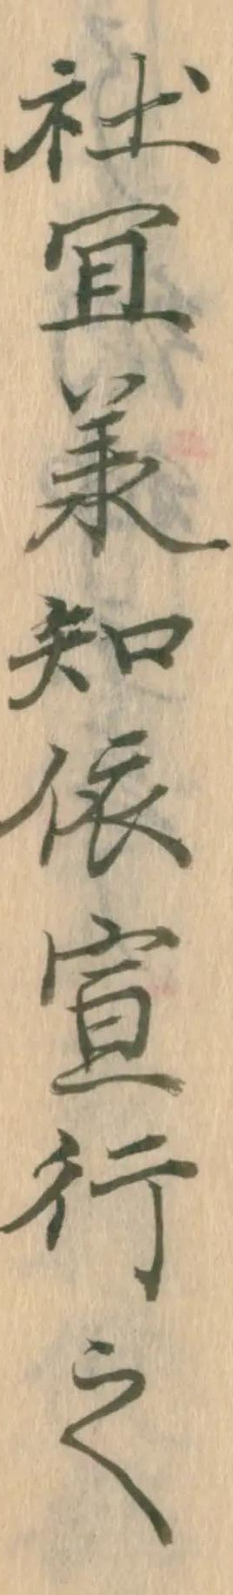社宜承知依宣行之
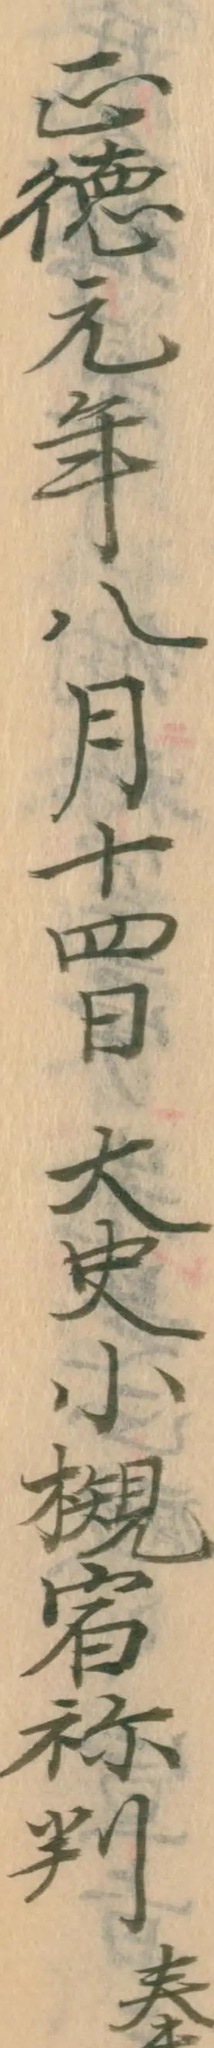正徳元年八月十四日大史小槻宿祢判奉
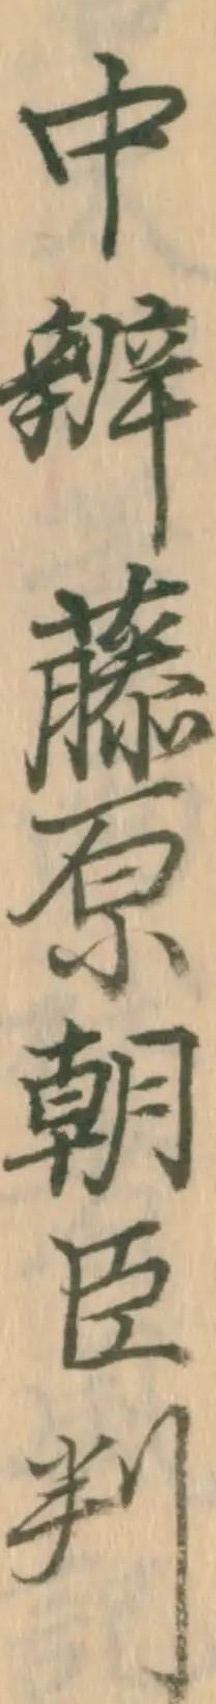中弁藤原朝臣判
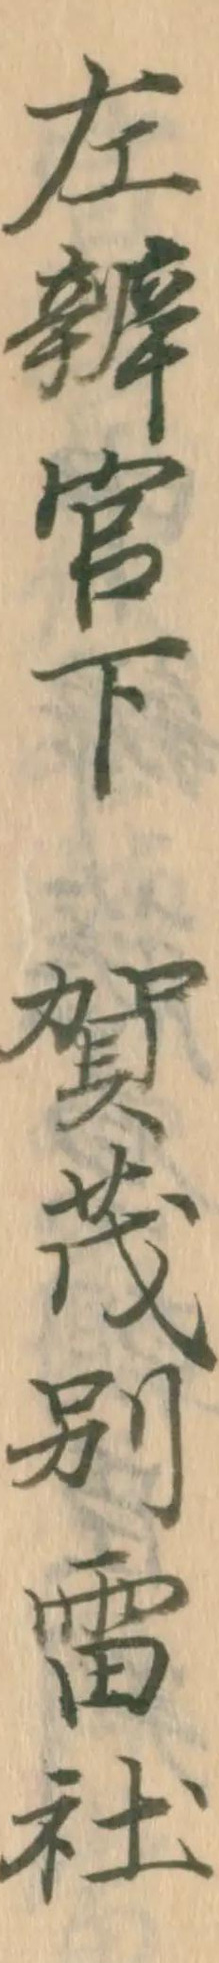左弁官下賀茂別雷社
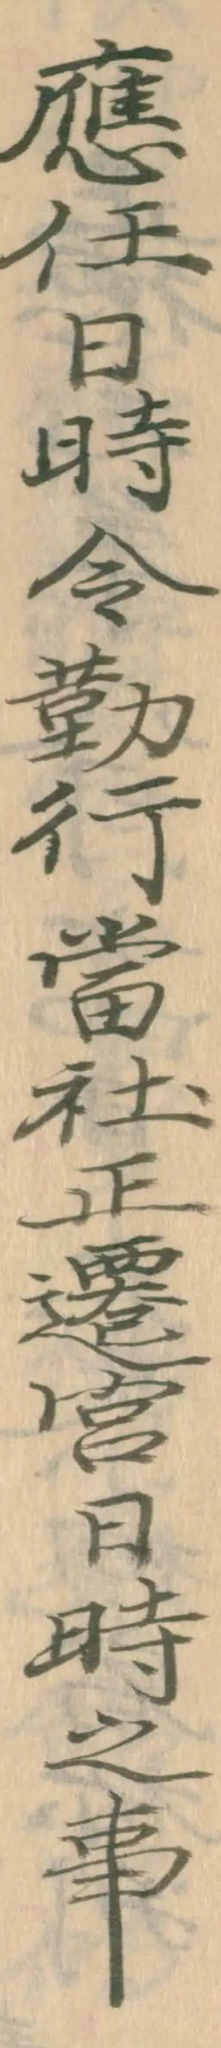応任日時令勤行当社正遷宮日時之事
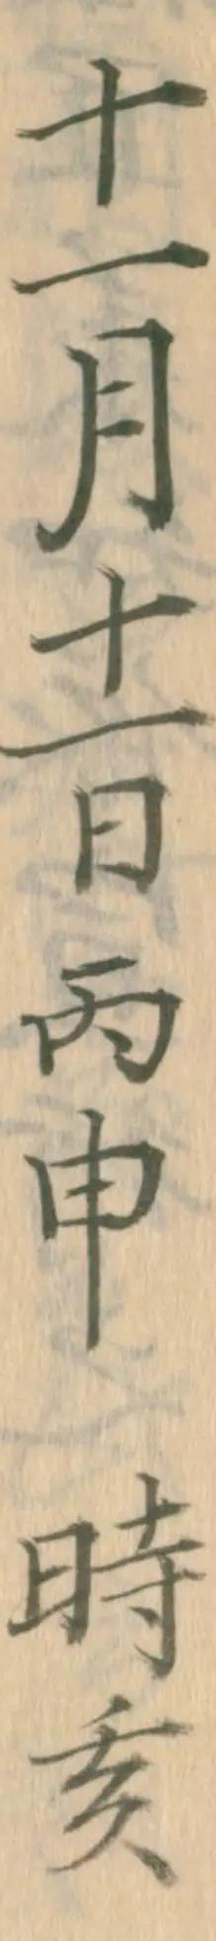十一月十一日丙申時亥
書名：賀茂社記録. 第16冊
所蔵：国立国会図書館 National Diet Library, JAPAN
